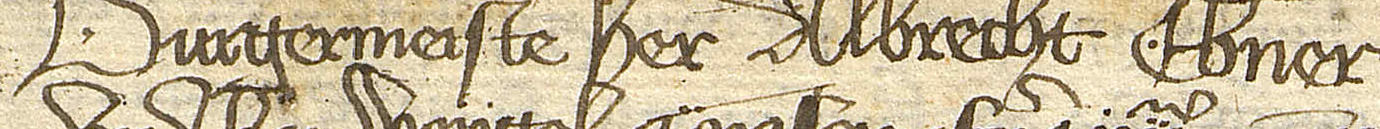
Burgermeiste* Her Albrecht Ebner
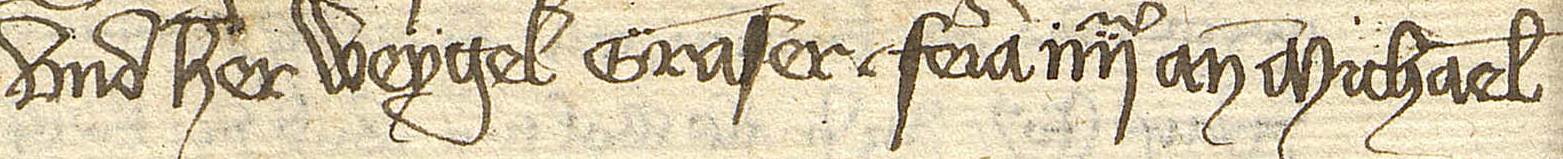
vnd Her Weygel Graſer feia* iiii* an* Michael*
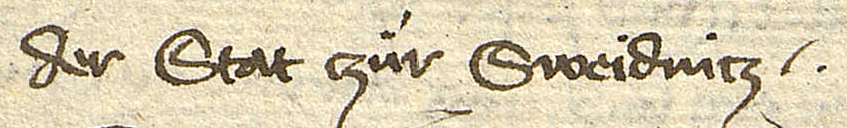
der Stat cʒür Sweidnicʒ / .
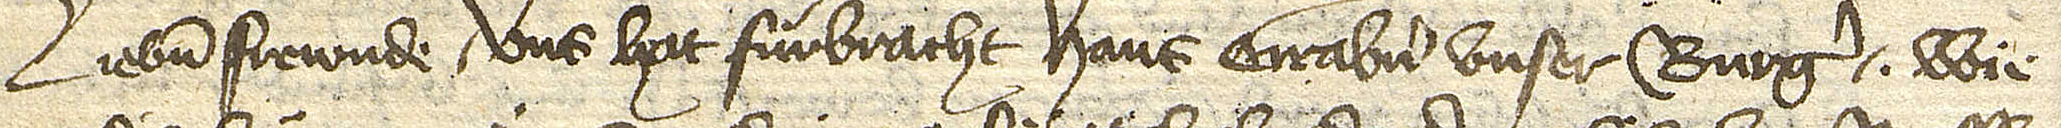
Liebn* frewnde / Vns hat fürbracht hans Grabn* vnſer Burg* / . wie
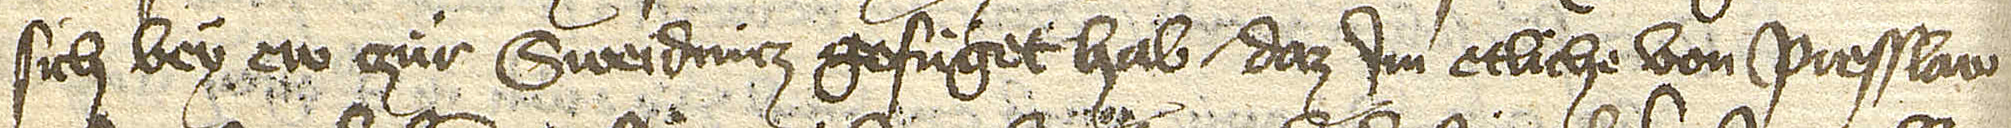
ſich bey ew cʒür Sweidnicʒ gefüget hab / daʒ Im etliche von Preſſlaw
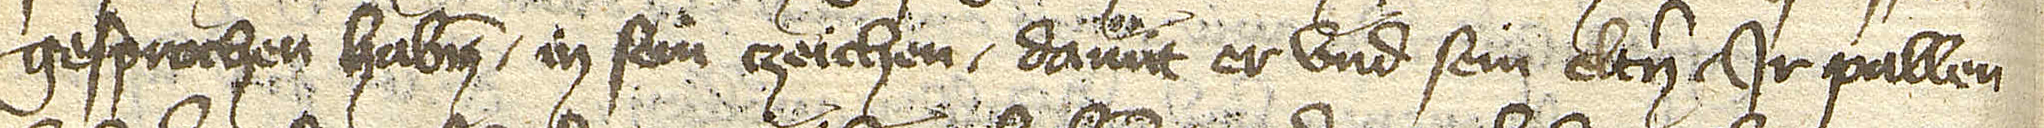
geſprochen habn* / in ſein cʒeichen / damit er vnd ſein eltn* / Ir pallen
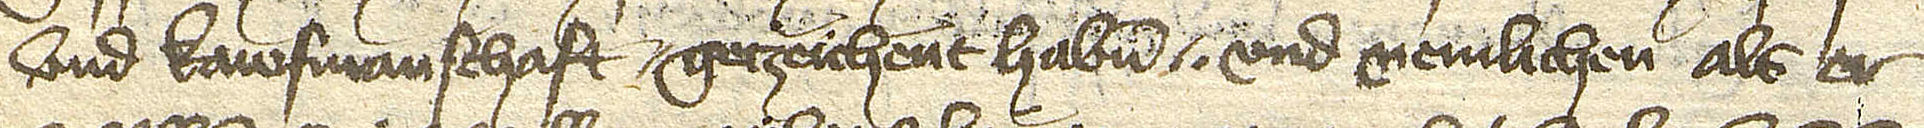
vnd kawfmanſchaft / gecʒeichent habn* / . vnd nemlichen als er
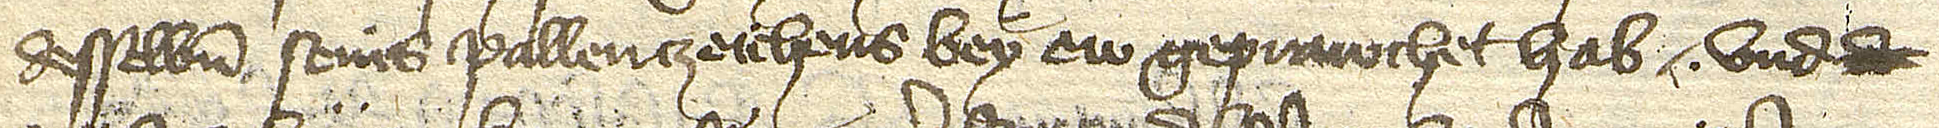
deſſelbn* ſeins pallencʒeichens bey ew geprawchet hab / . vnd d
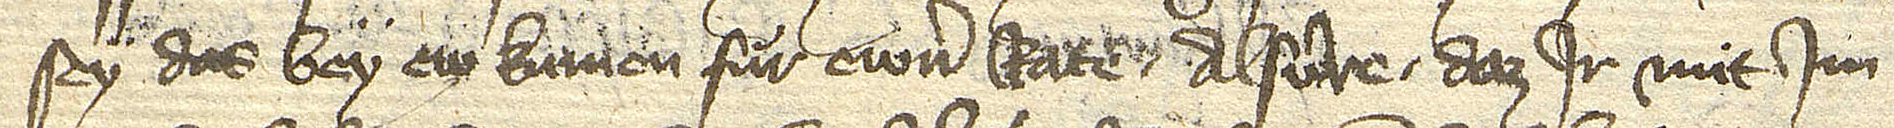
ſey das bey ew kumen für ewn* Rate / Alſu*re / daʒ Ir mit Im
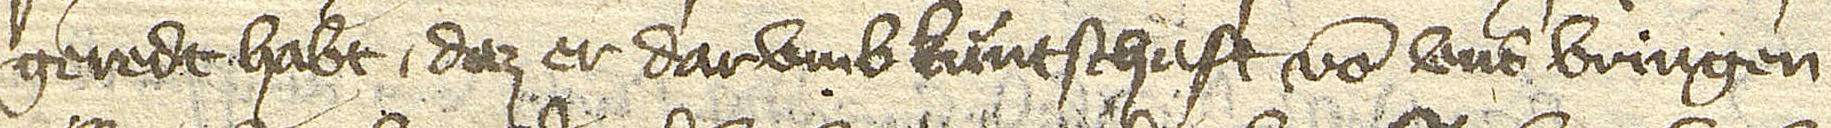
geredt habt / daʒ er darvmb küntſchaft vo* vns bringen
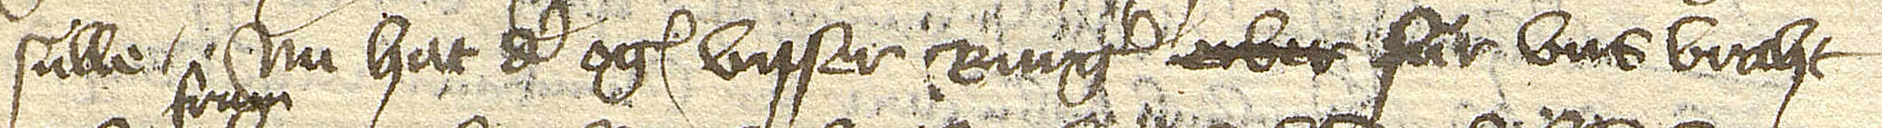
ſülle / . Nu hat d* og* vnſer Burg* erber für vns braht
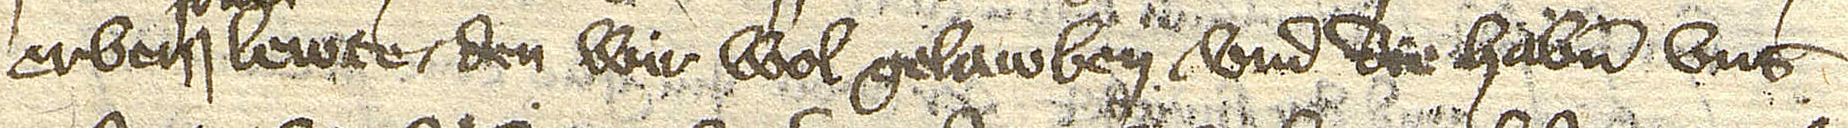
erber / lewte / den wir wol gelawben / vnd die habn* vns
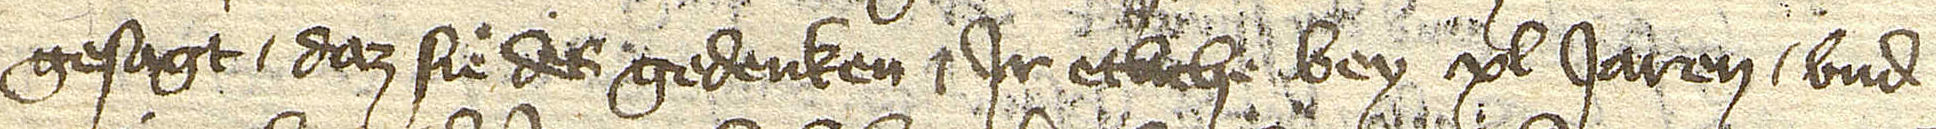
geſagt / daʒ ſie des gedenken / Ir etliche bey xl Iaren / vnd
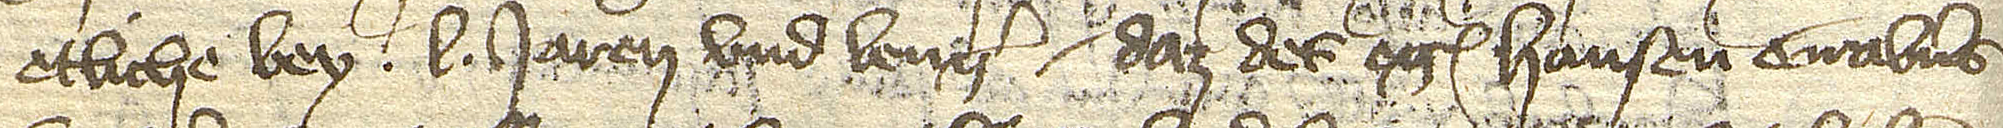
etliche bey . l . Iaren vnd leng* / daʒ des eg* hanſen Grabn*s
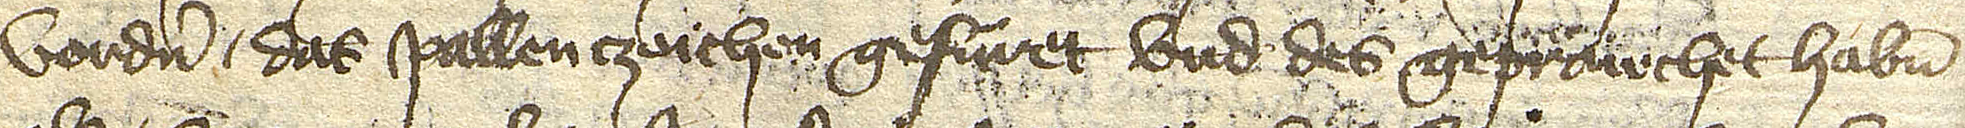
vordn* / das pallencʒeichen gefüret vnd des geprawchet habn*
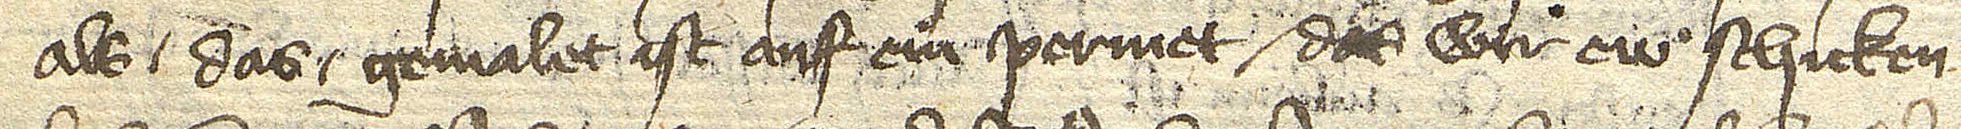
als / das / gemalet iſt auf ein permet / das wir ew ſchicken
